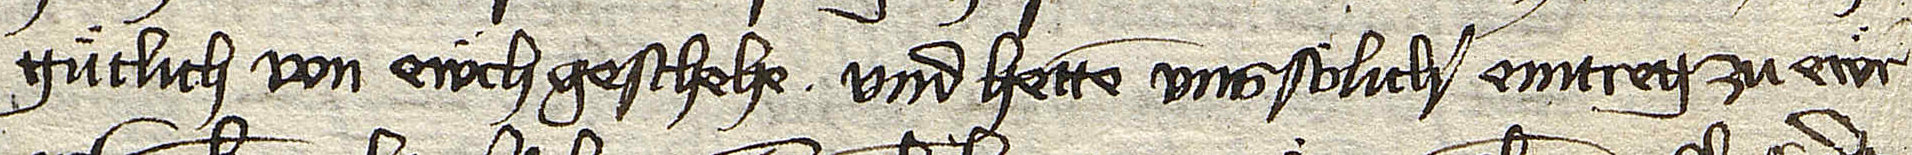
gütlich von eẅch geſchehe . vnd hette* vns ſölich* eintreg ʒu eẅr*
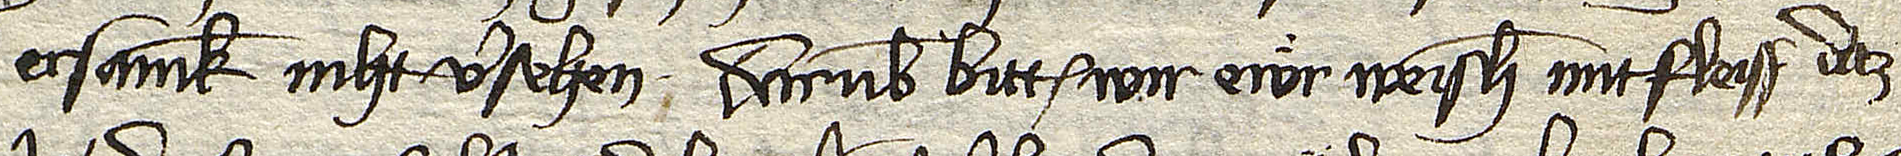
erſamk* niht v*ſehen . Darub* bitt* wir eẅr weiſh* mit fleiſſ daʒ
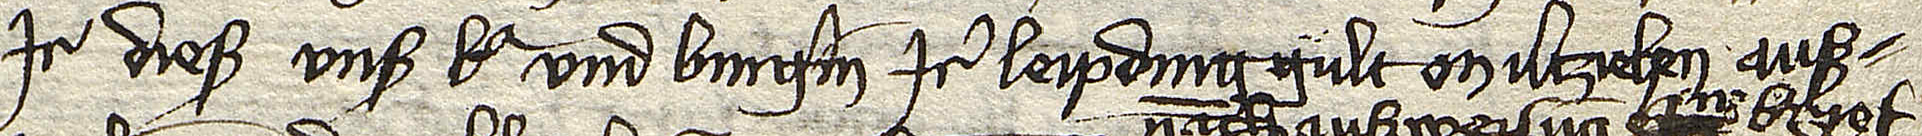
Ir dieſ* vnſ* b* vnd burg*in Ir* leipding gült on u*cʒiehen auſʒ =
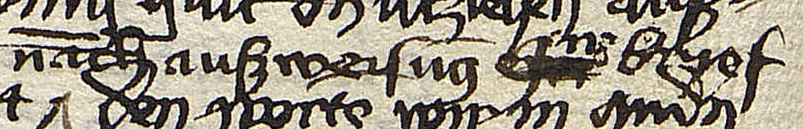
nach auſʒweiſu*g ein brief
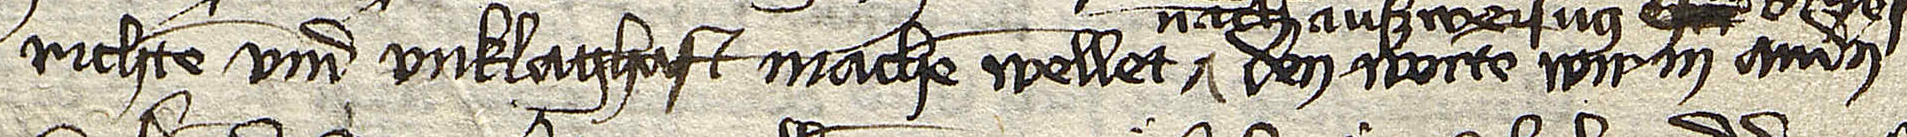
richte* vnd vnklaghaft mache* wellet Den worte* wir in andn*
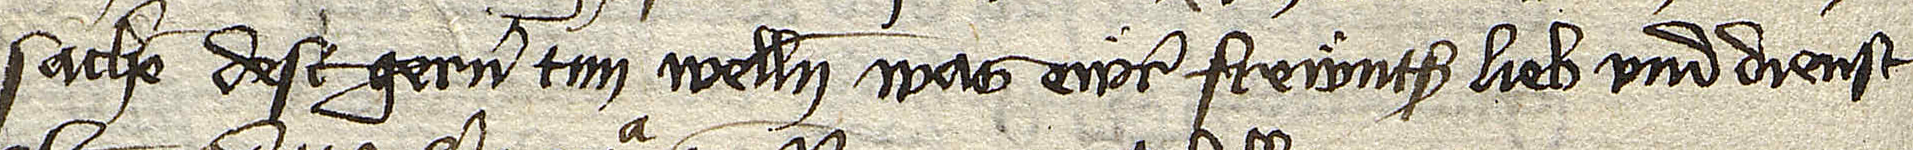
ſache* deſt gern* tun welln* was eẅr* freẅntſ* lieb vnd dienſt
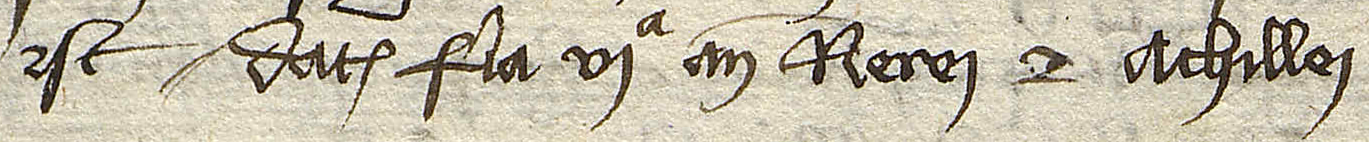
iſt / Dat* fi*a vi* an* Nerey @ Achillei
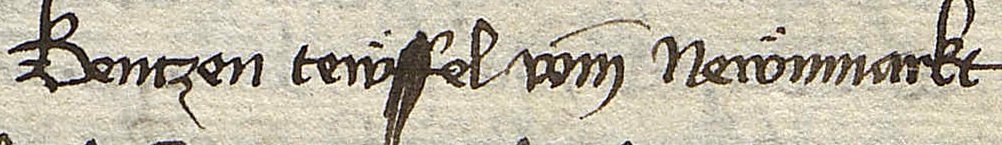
Bencʒen teẅffel vom* Neẅnmarkt
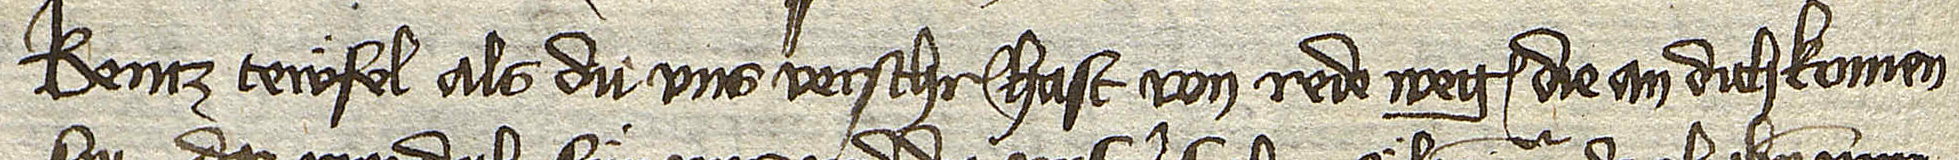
Bencʒ teẅfel als du vns verſchr* haſt von rede weg* die an dich komen
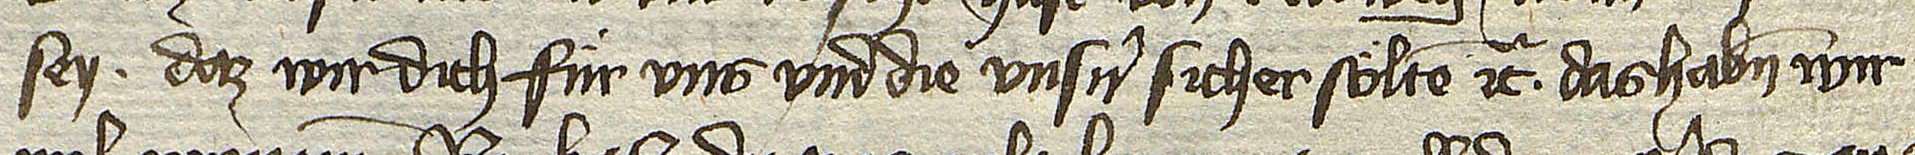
ſey . daʒ wir dich für vns vnd die vnſn* ſicher ſölte* ec* . das habn* wir
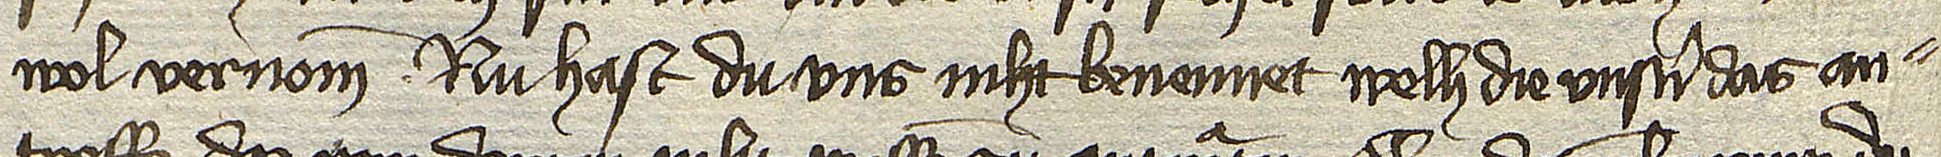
wol vernom* . Nu haſt du vns niht benennet welh die vnſn* das an =
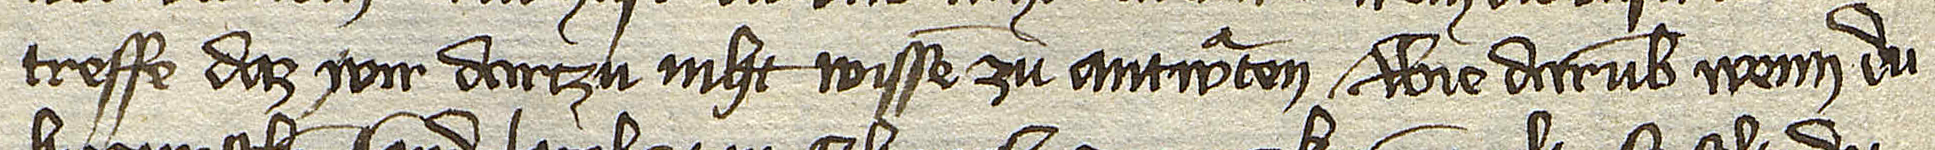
treffe daʒ wir darcʒu niht wiſſe* ʒu antw*ten / wie darub* wenn du
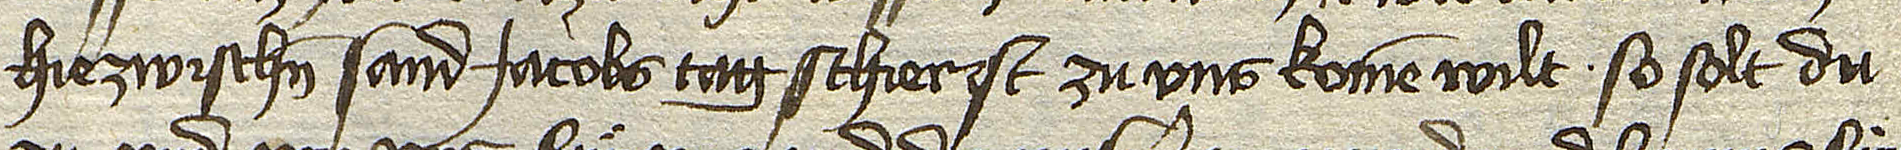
hieʒwiſchn* ſand Iacobs tag ſchieriſt ʒu vns kome* wilt . ſo ſolt du
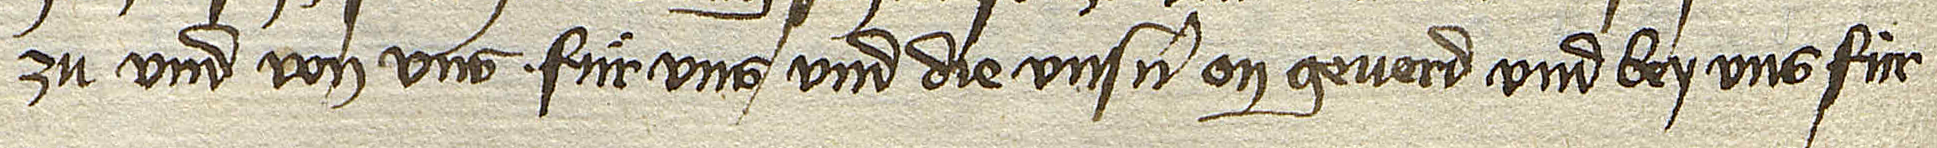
ʒu vnd von vns . für vns vnd die vnſn* on geuerd vnd bey vns für
